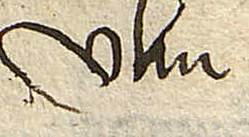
Vlm
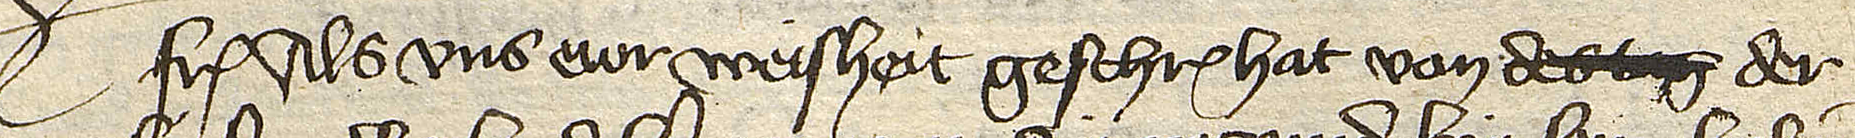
L* fr* Als vns ewr weiſheit geſchr* hat von des tag der
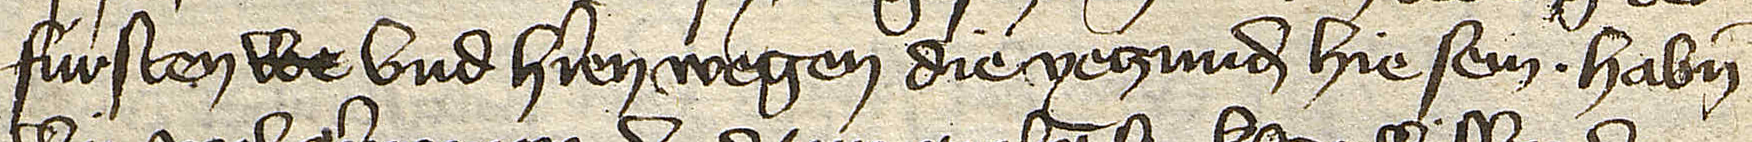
fürſten we vnd hr*en wegen die yecʒund* hie ſein . habn*
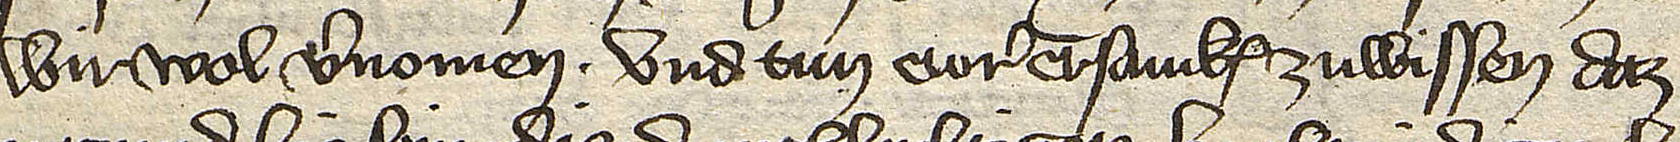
wir wol v*nomen . vnd tun ewr* erſamk* cʒuwiſſen daʒ
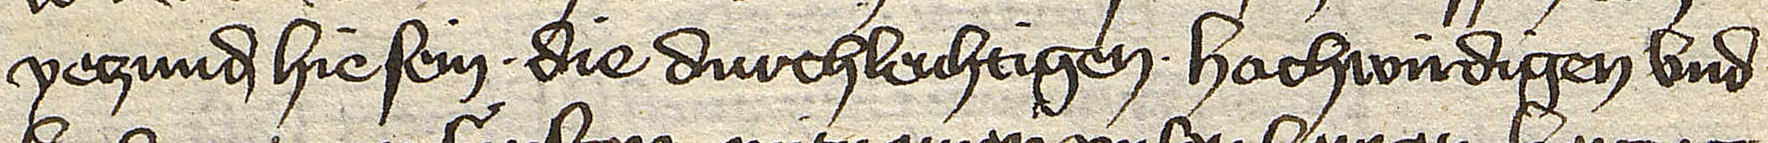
yecʒund* hie ſein . die durchleuhtigen . hochwirdigen vnd
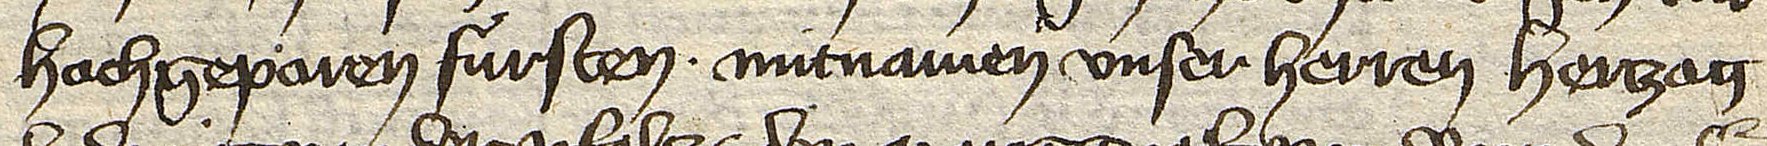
hochgeporen fürſten . mitnamen vnſer herren hercʒog
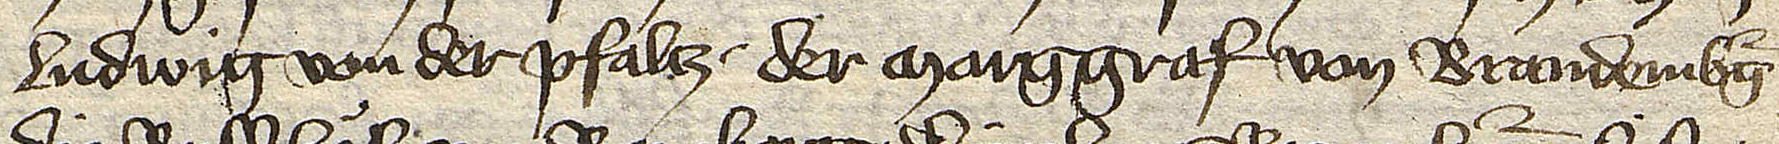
Ludwig von der Pfalcʒ / der Marggraf von Brandemb*g
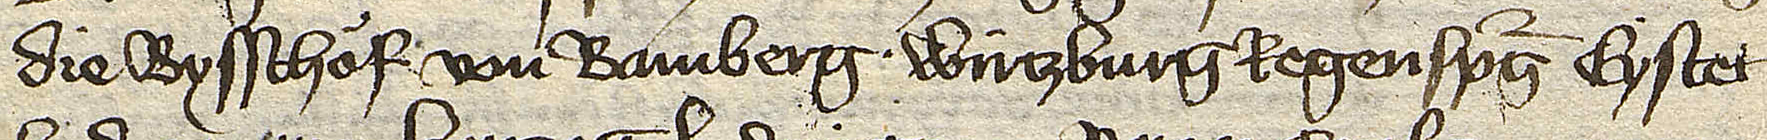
die Byſſchöf von Bamberg . Wircʒburg Regenſp*g Eyſtet
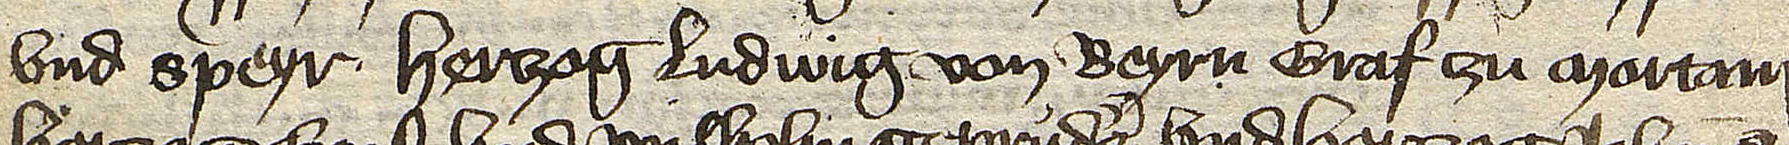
vnd Speyr . hercʒog Ludwig von Beyrn Graf cʒu Mortani
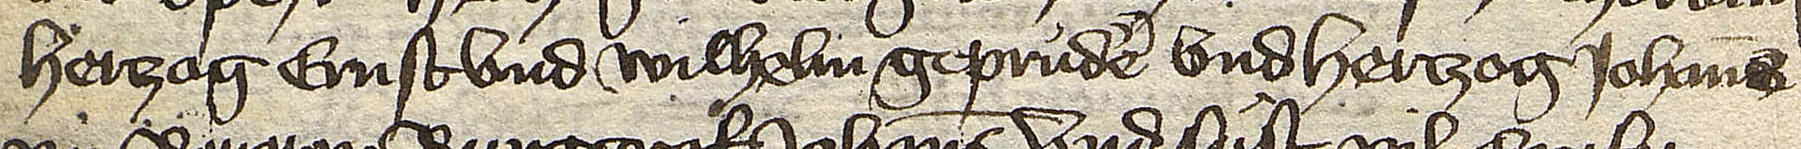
hercʒog Ernſt vnd wilhelm geprüde* vnd hercʒog Iohans*
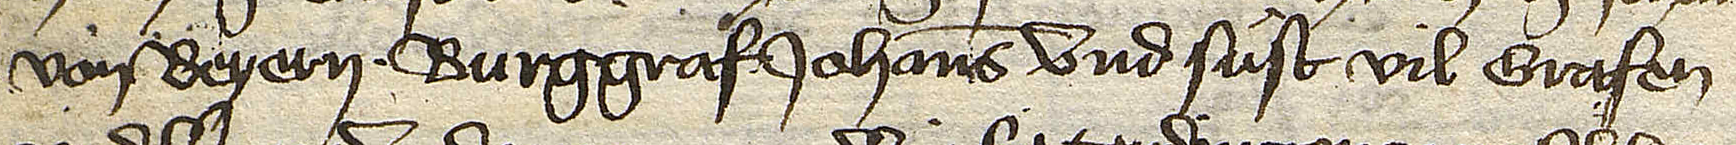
von Beyern . Burggraf Iohans* vnd ſüſt vil Grafen
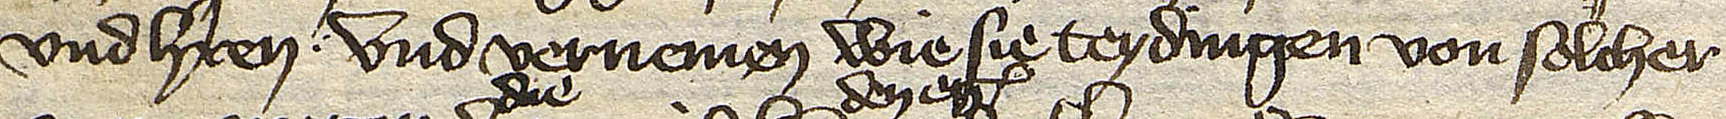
vnd h*ren . vnd vernemen wie ſie teydingen von ſolcher
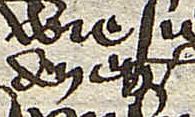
den eg*
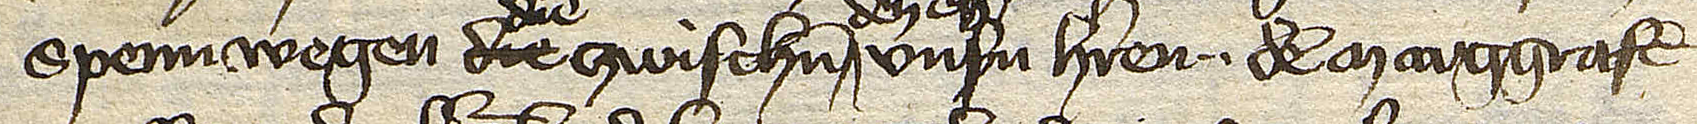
Spenn wegen die cʒwiſchen* vnſ*n hr*en ~ de* Marggrafe*
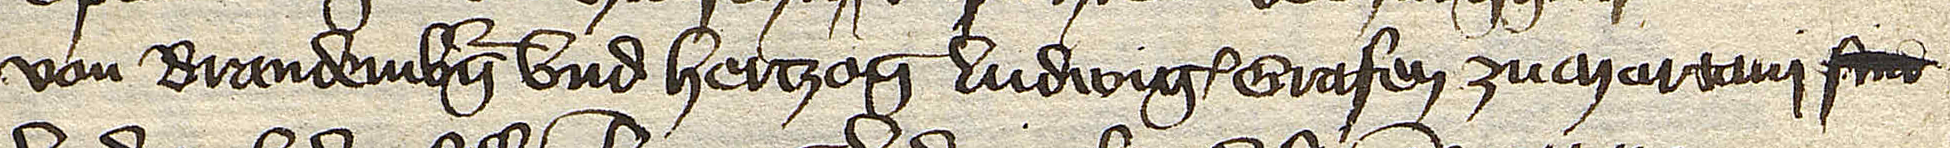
von Brandemb*g vnd hercʒog Ludwig* Grafen cʒu Mortani ſind
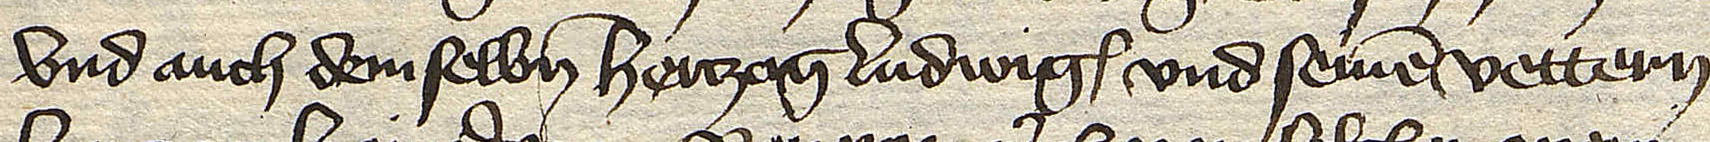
vnd auch demſelbn* hercʒog Ludwig* vnd ſeine* vettern
